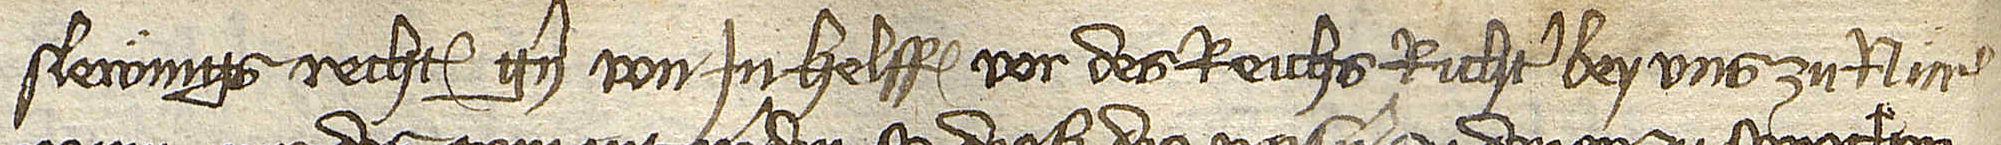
ſleẅnigs reht* g*n von In helff* vor des Reichs Richt* bey vns ʒu Nur*
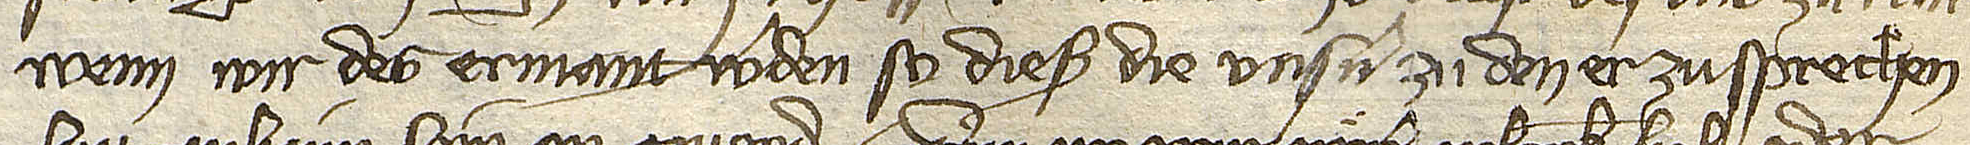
wenn wir des ermant w*den ſo dieſ* die vnſn* ʒu den er ʒu ſprechen
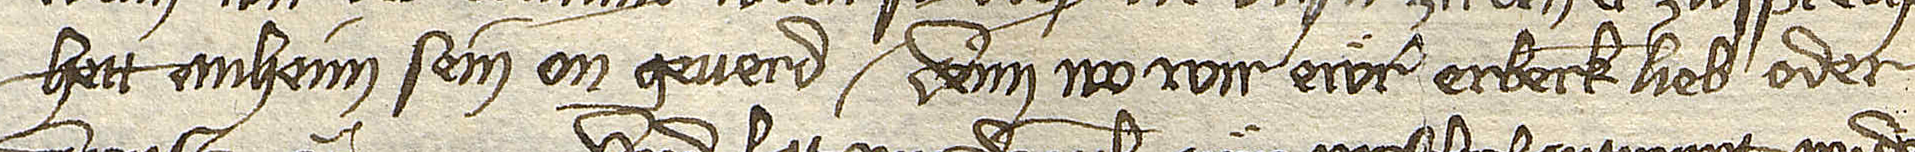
hett anheim ſein on geuerd / Denn wo wir eẅr* erberk* lieb oder
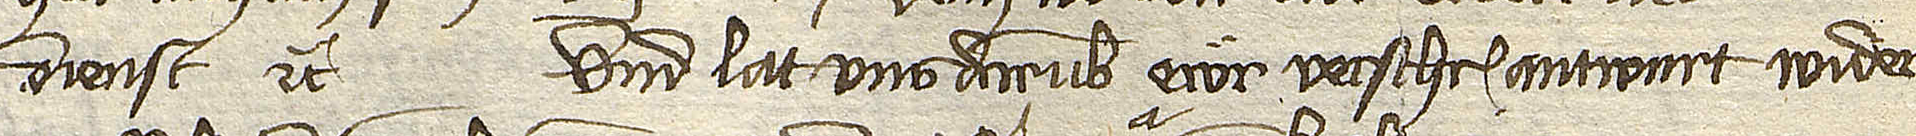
dienſt ec* Vnd lat vns darub* eẅr verſchr* antwurt wider
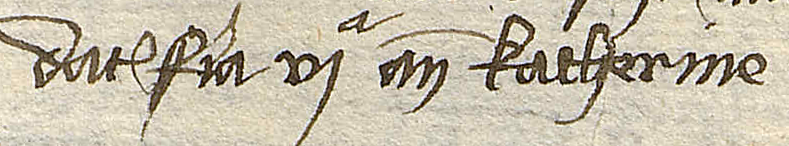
Dat* fi*a vi* an* katherine
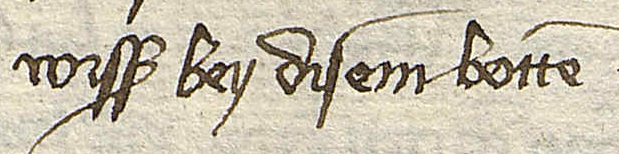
wiſſ* bey diſem botte*
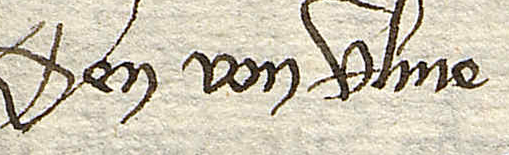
Den von Vlme
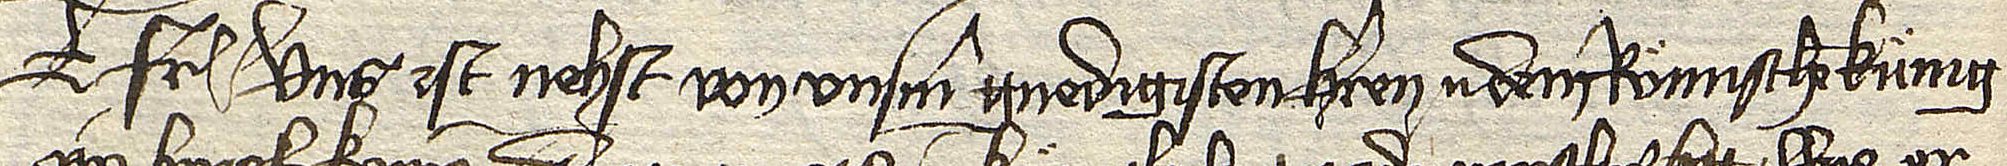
L* fr* / Vns iſt nehſt von vnſm* gnedigiſten h*ren ~ dem Römiſche* künig
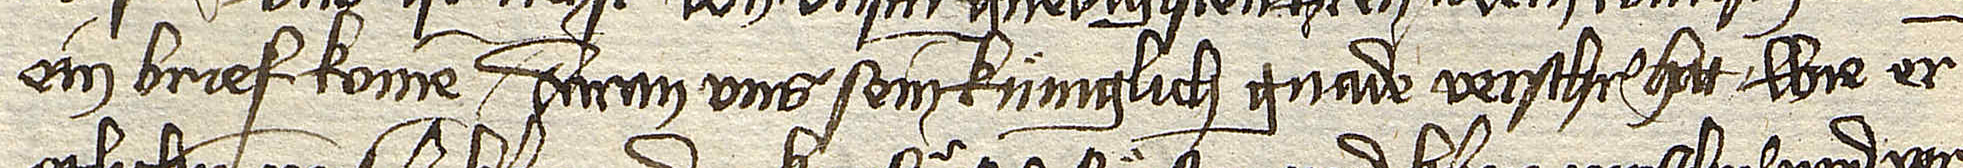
ein brief kome* / Daran vns ſein küniglich gnade verſchr* hat / wie er
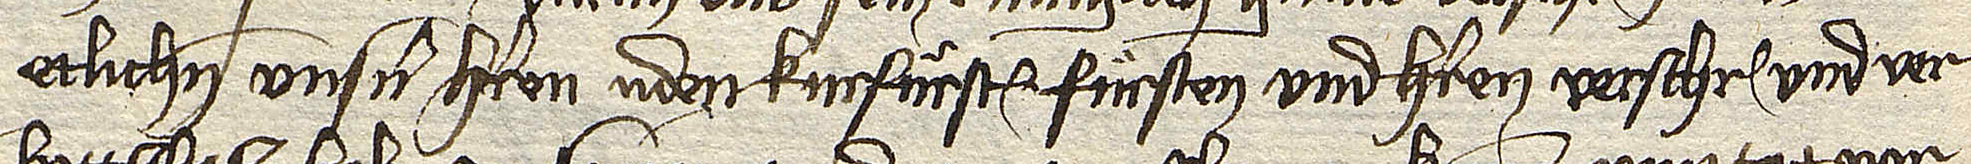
etlichn* vnſn* h*ren ~ den kurfürſt* . fürſten vnd h*ren verſchr* vnd ver
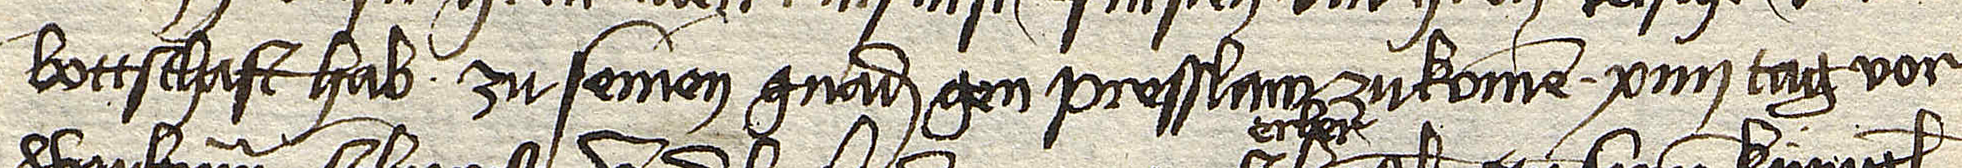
bottſchaft hab . ʒu ſeinen gnad* gen Preſſlaw ʒu kome* . xiiii tag vor
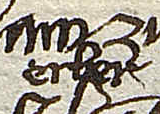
erber
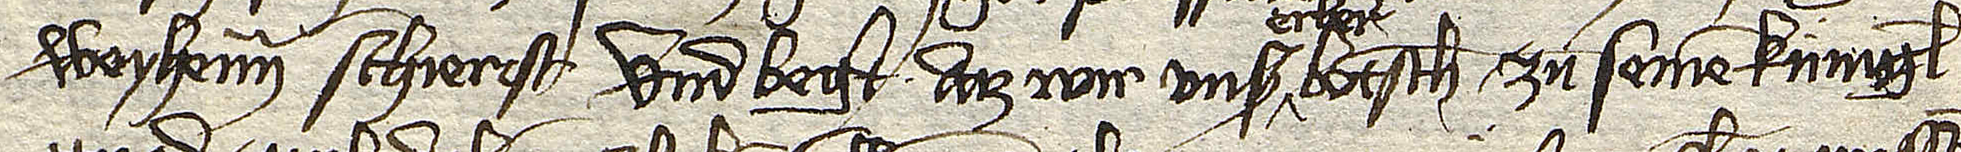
Weyheim ſchieriſt Vnd beg*t . daʒ wir vnſ* botſch* / ʒu ſeine* künigl*
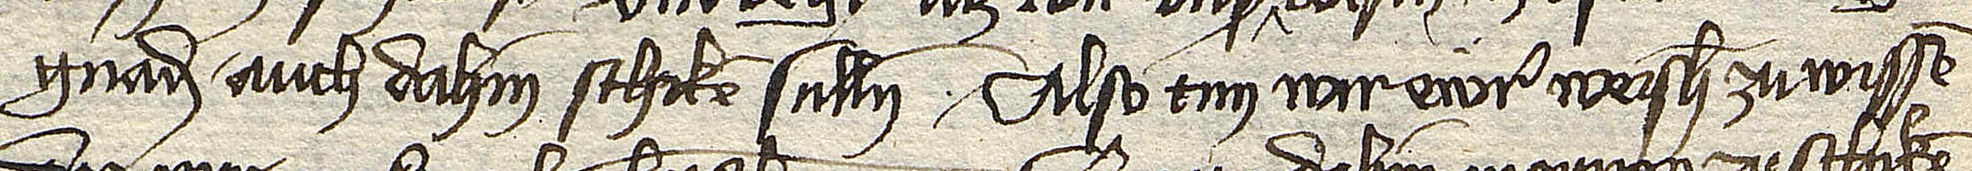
gnad* / auch dahin ſchike* ſulln* / Alſo tun wir eẅr* weiſh* ʒu wiſſe*
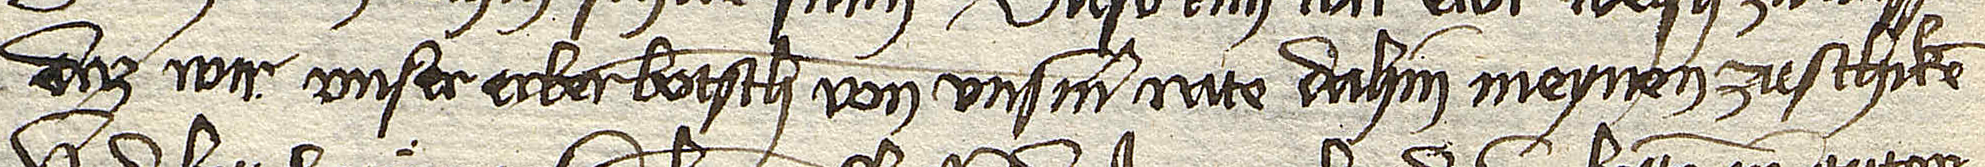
Daʒ wir vnſer erber botſch* von vnſm* rate dahin meynen ʒu ſchike*
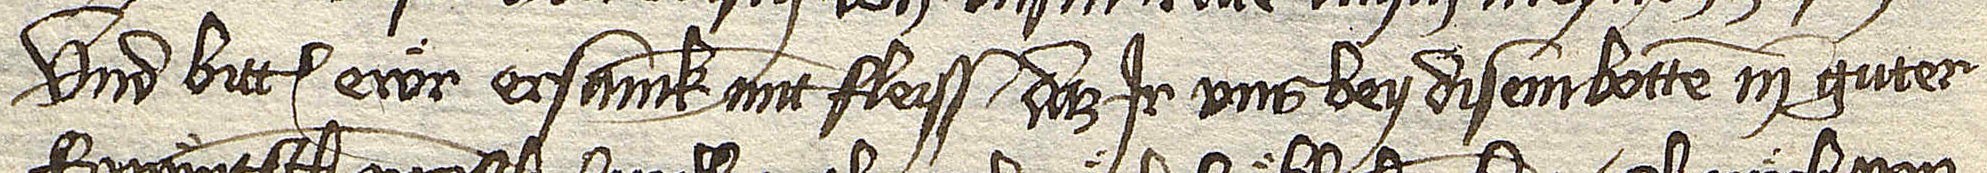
Vnd bitt* eẅr erſamk* mit fleiſſ / Daʒ Ir vns bey diſem botte* in guter
